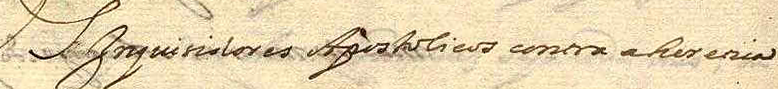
Os Jnquisidores Apostolicos contra a heretica
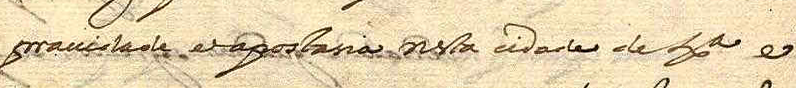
prauidade e apostasia nesta cidade de Lx.a e
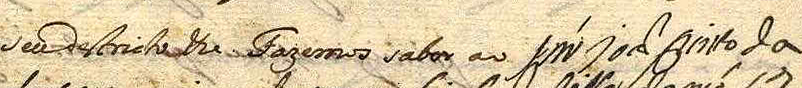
seu destricto etc Fazemos saber ao Snr̄ joaõ pinto da
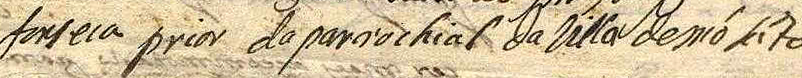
fonseca prior da parrochial da Villa de mōsāto
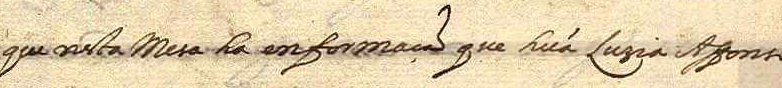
que nesta Mesa há informaçaõ que huā Luzia Affonso
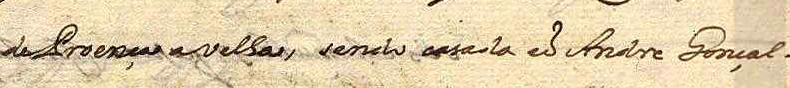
de Proença a velha, sendo casada cō Andre Gonçal
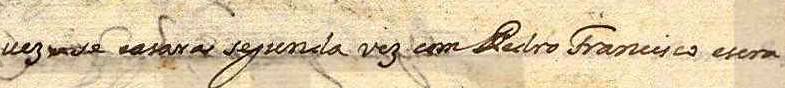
uez se casara segunda vez com Pedro Francisco escra
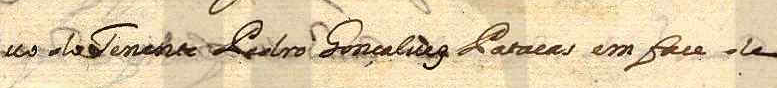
uo do Tenente Pedro Gonçaluez Patacas em face da
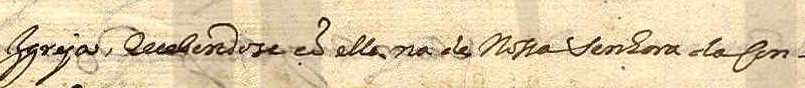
Jgreja, Recebendo se cō elle na de Nossa Senhora da Con
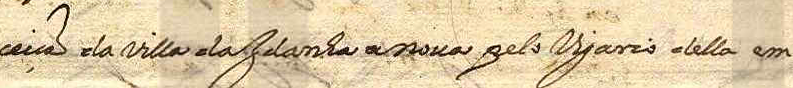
ceiçaõ da villa da Jdanha a noua pelo Vigario della em
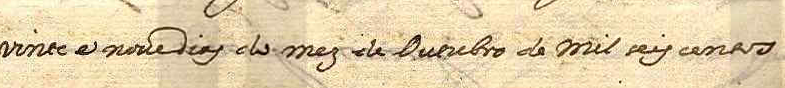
vinte e noue dias do mez de Outubro de mil seiscentos
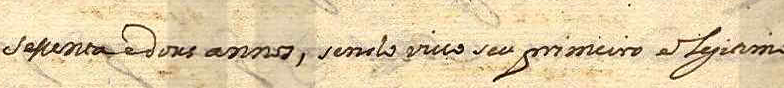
sessenta e dous annos, sendo viuo seu primeiro e legitimo
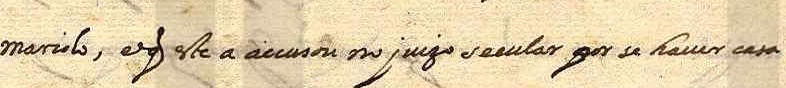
marido, e q̄ este a accusou no juizo secular por se hauer casa
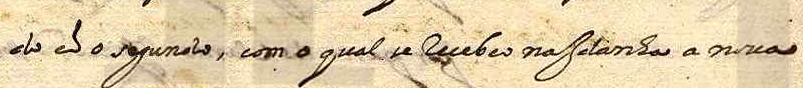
do cō o segundo, com o qual se recebeu na Idanha a noua.
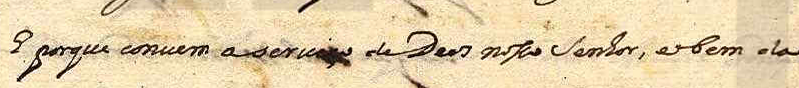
E porque conuem a seruiço de Deos nosso Senhor, e bem da
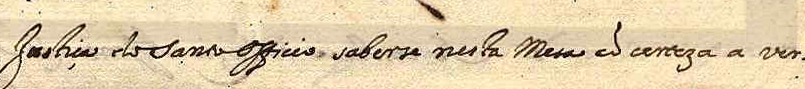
Justiça do Santo Officio saber se nesta Mesa cō certeza a ver
